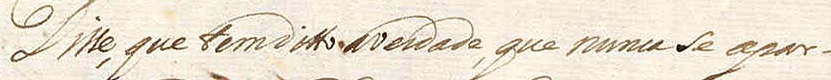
Disse, que tem ditto a verdade, que nunca se apar
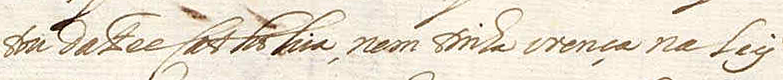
tou da Fee Catholica, nem tinha crença na Ley
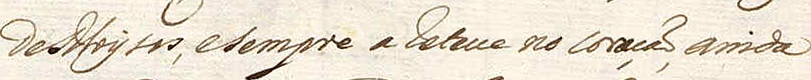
de Moyses, e sempre a Reteve no coração, ainda
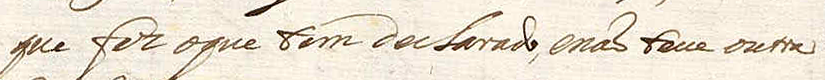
que fez o que tem declarado e naõ teue outra
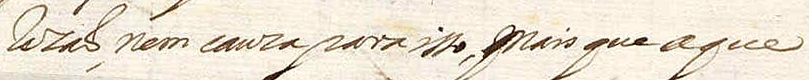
Rezaõ, nem cauza para isso, mais que a que
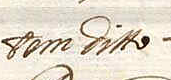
tem ditto
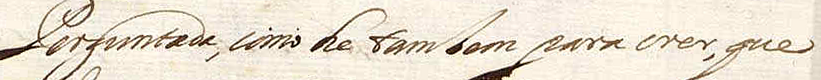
Perguntada, como he tambem para crer, que
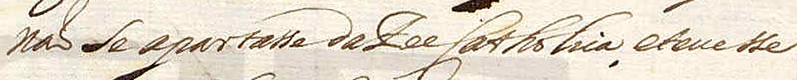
naõ se apartasse da Fee Catholica, e teuesse
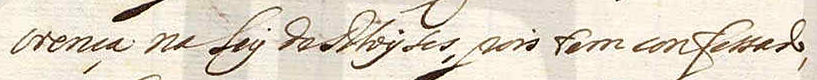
crença na Ley de Moyses, pois tem confessado,
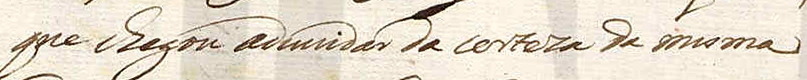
que chegou a duuidar da certeza da mesma
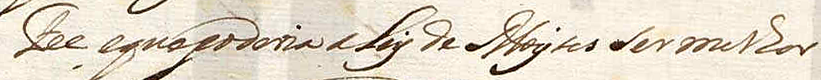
Fee e que poderia a Ley de Moyses ser melhor
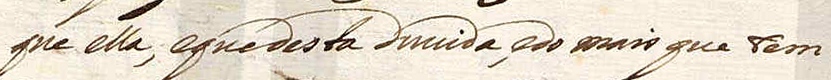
que ella, e que desta duuida, e do mais que tem
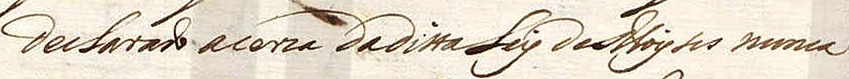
declarado acerca da ditta Ley de Moyses nunca
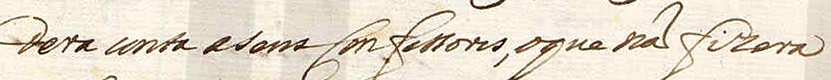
dera conta a seus Confessores, o que naõ fizera
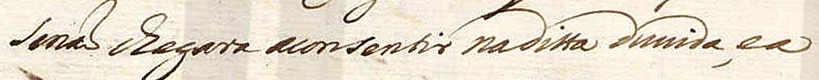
se não chegara a consentir na ditta duuida, e a
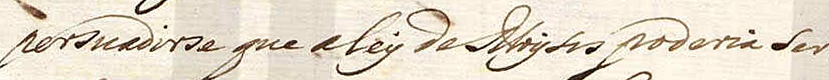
persuadirse que a ley de Moyses, poderia ser
